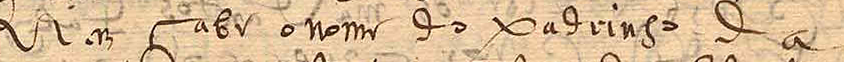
Nem sabe o nome do padrinho da
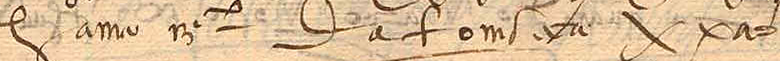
chama mel da fomseca Xpaõ
